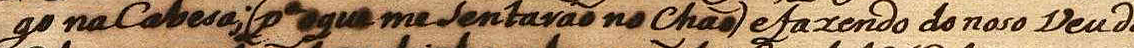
go na Cabesa; pa o que me sentaraõ no chaõ e fazendo do noso veu da
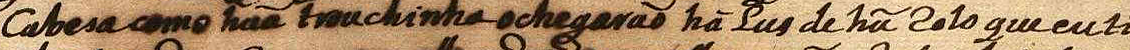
Cabesa como hūa trouchinha o chegaraõ há Lus de hū Rolo que eu ti
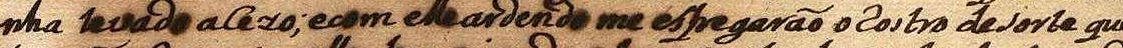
nha levado aCezo; e com elle ardendo me esfregarão o Rosto de sorte que
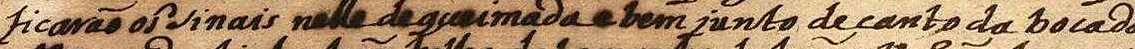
ficarão os sinais nelle de queimada e bem junto de canto da boca da
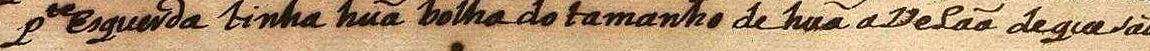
pte Esquerda tinha hūa bolha do tamanho de huā aVeLaã de que saõ
